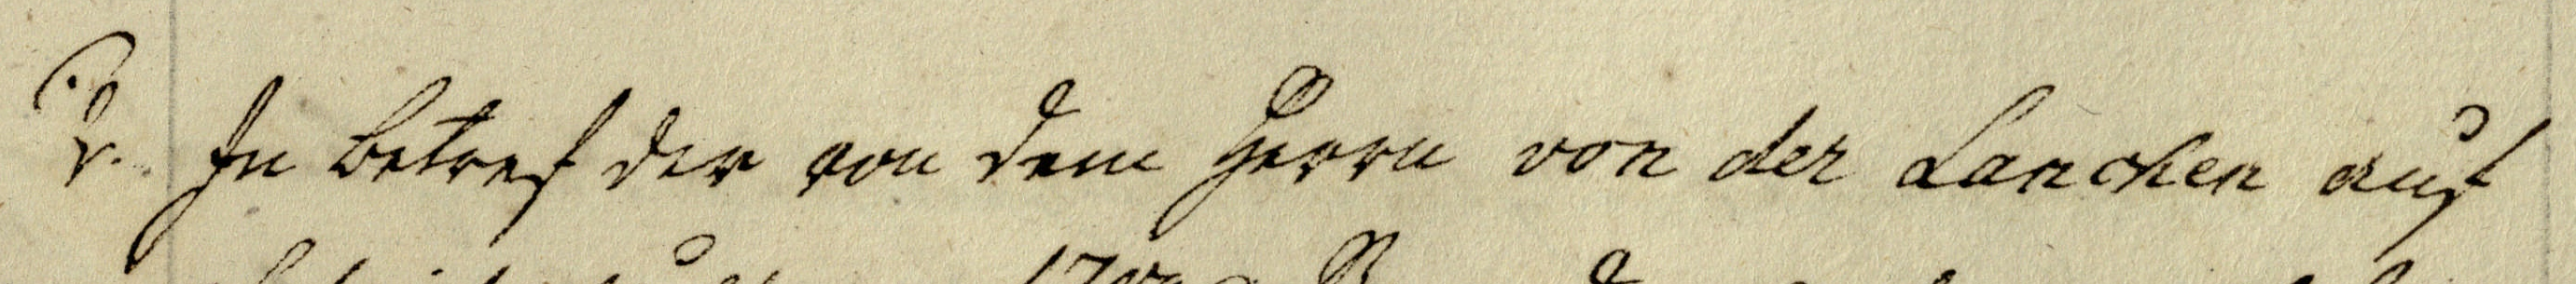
2. In Betref der von dem Herrn von der Lancken auf
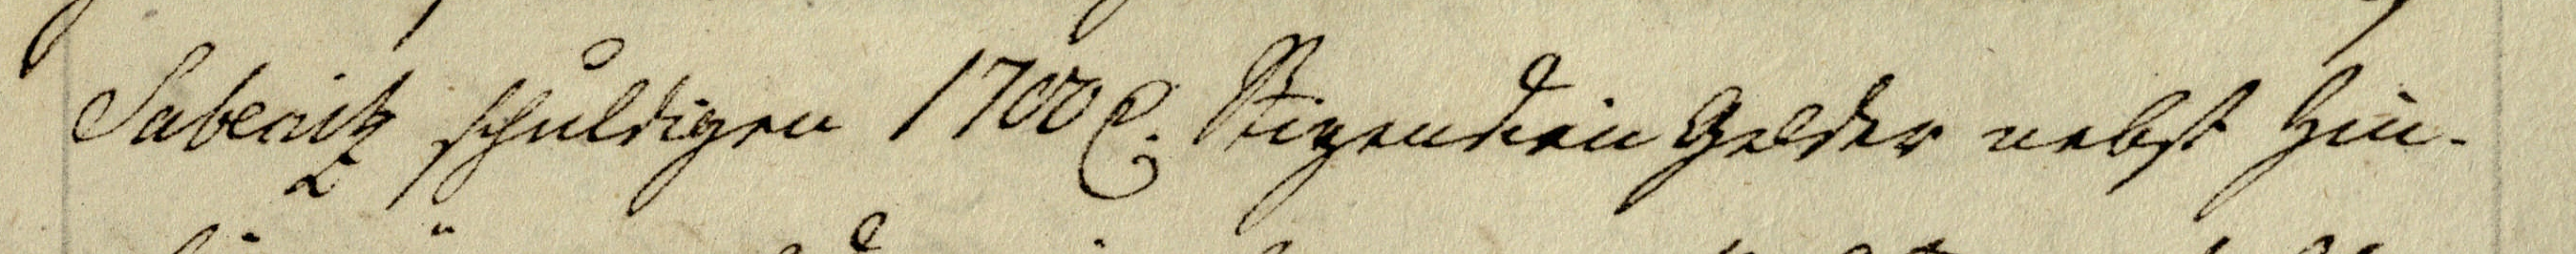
Sabenitz schuldigen 1700 l. Stipendien Gelder nebst Z¬in
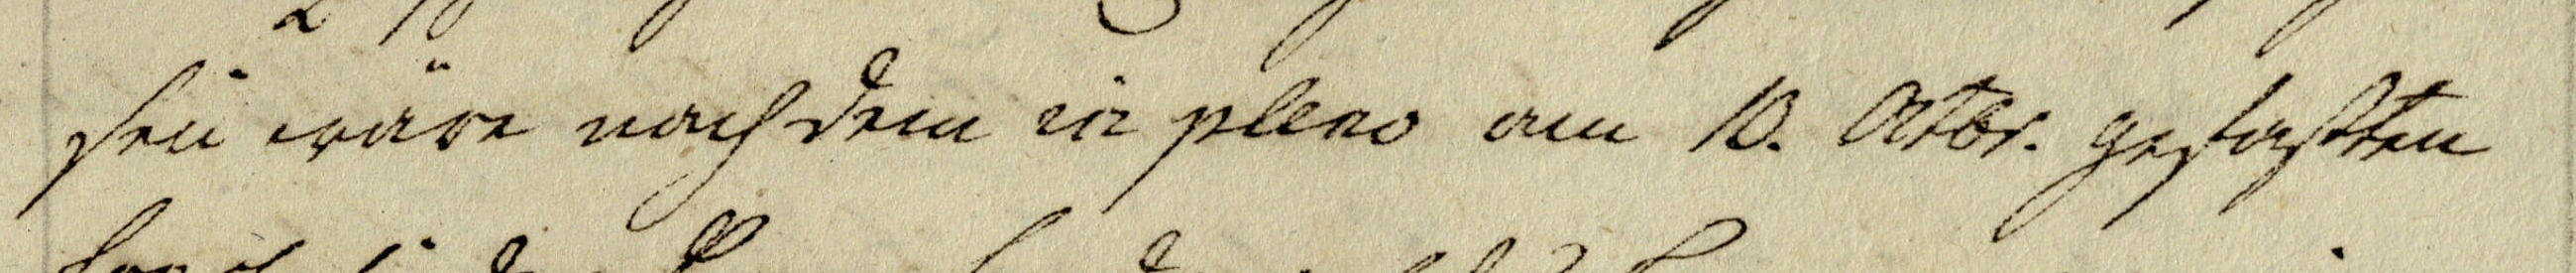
sen wäre nach dem in pleno am 10. Octbr. gefaßten
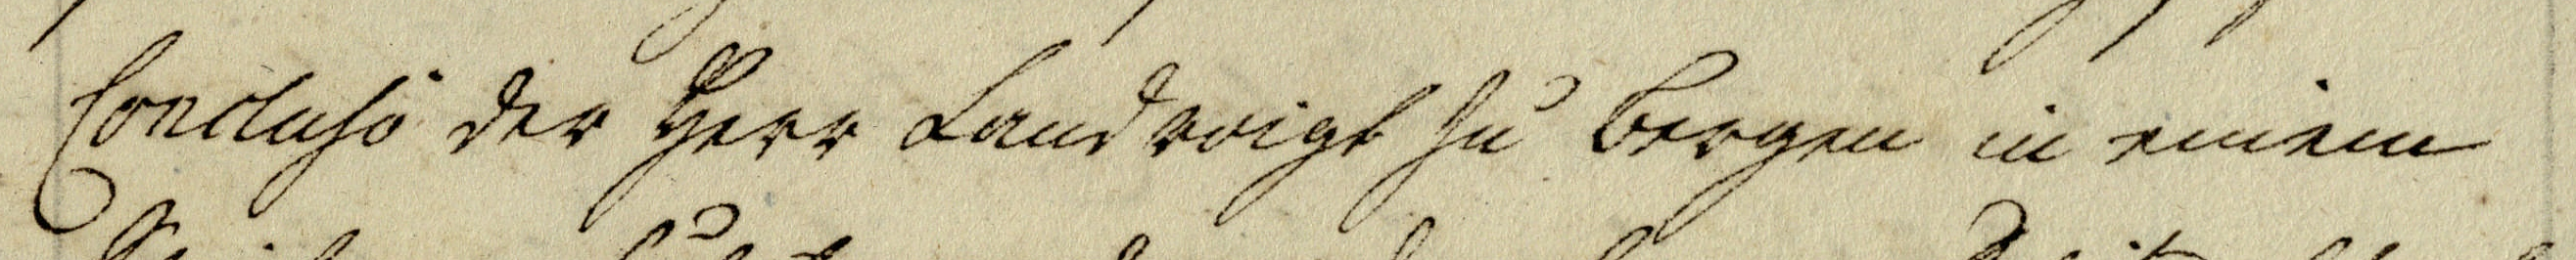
Concluso der Herr Land voigt zu Bergen in einem
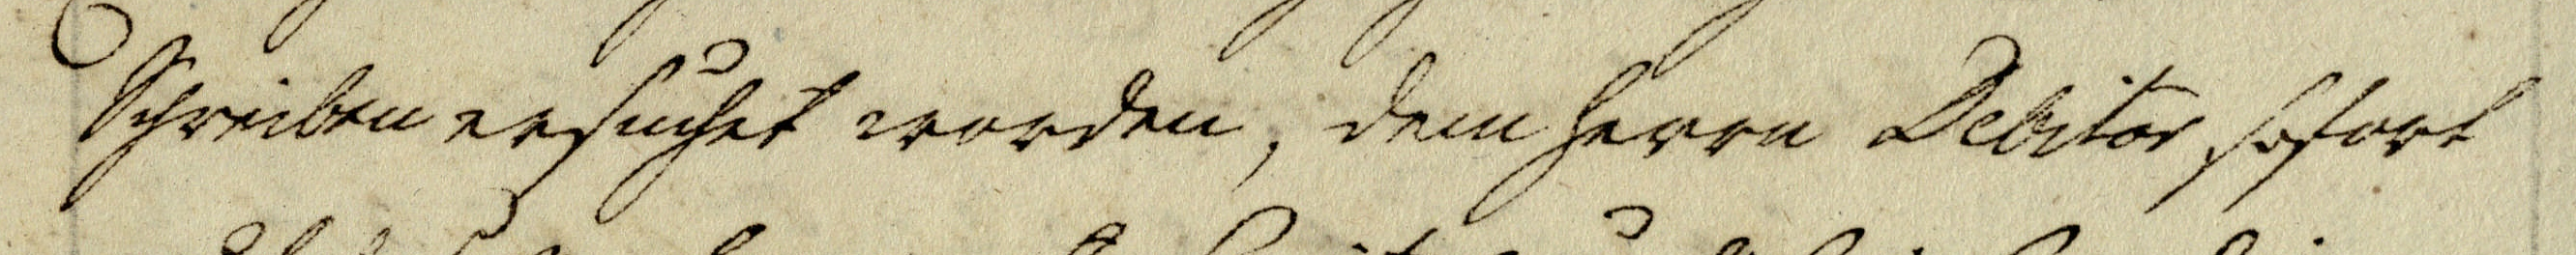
Schreiben ersuchet worden, dem Herrn Debitor sofort
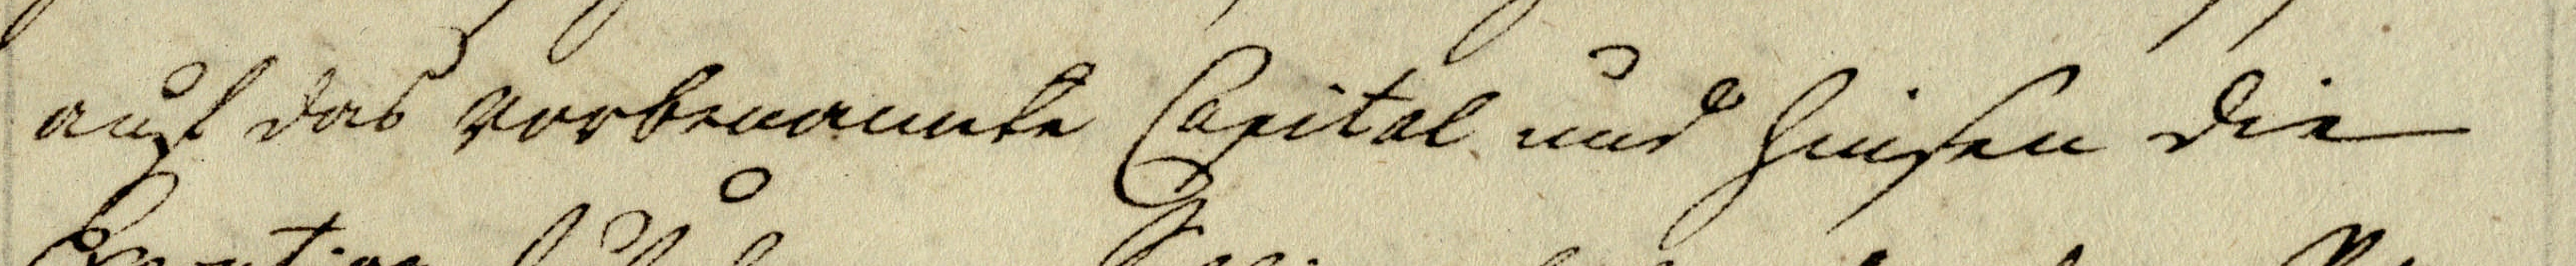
auf das vorbenannte Capital und Zinsen die
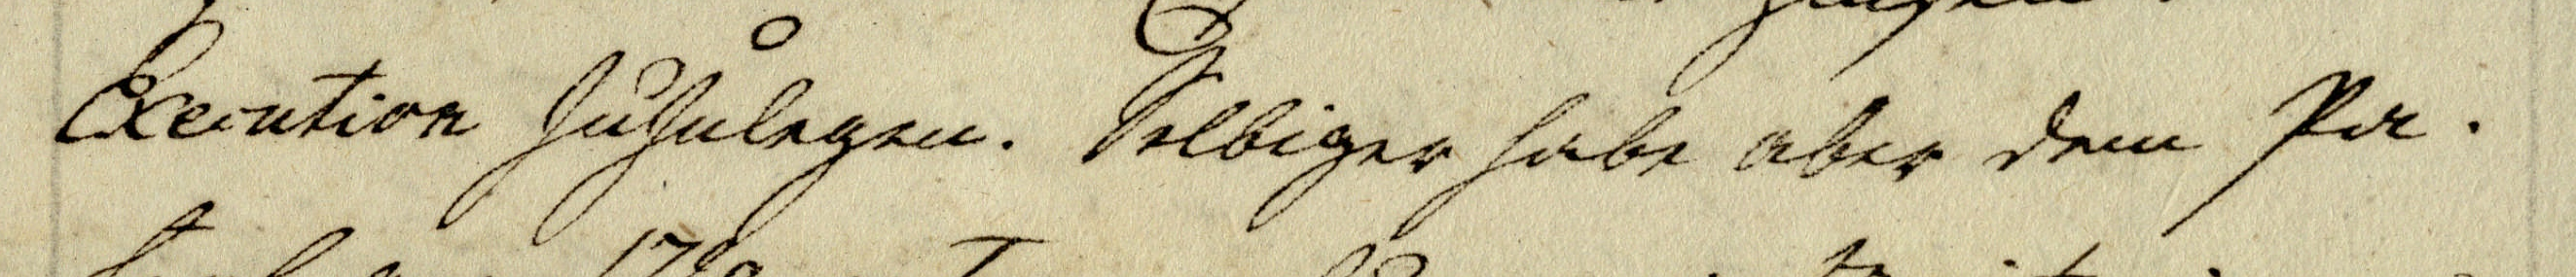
Execution zuzulegen. Selbiger habe aber dem Pa¬
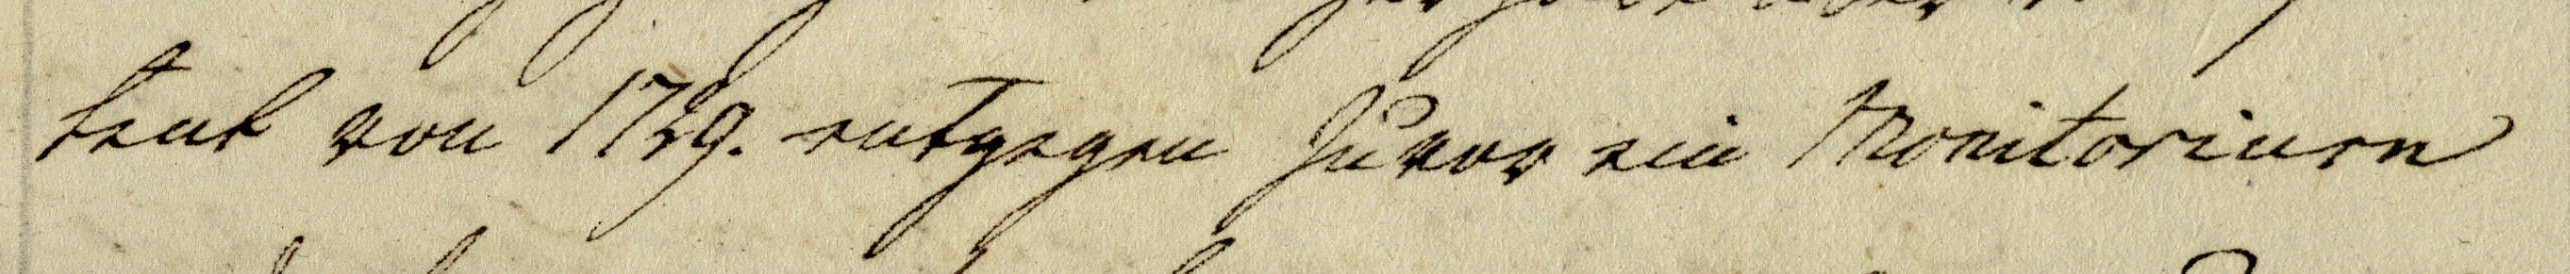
tent von 1729. entgegen zu vor ein Monitorium
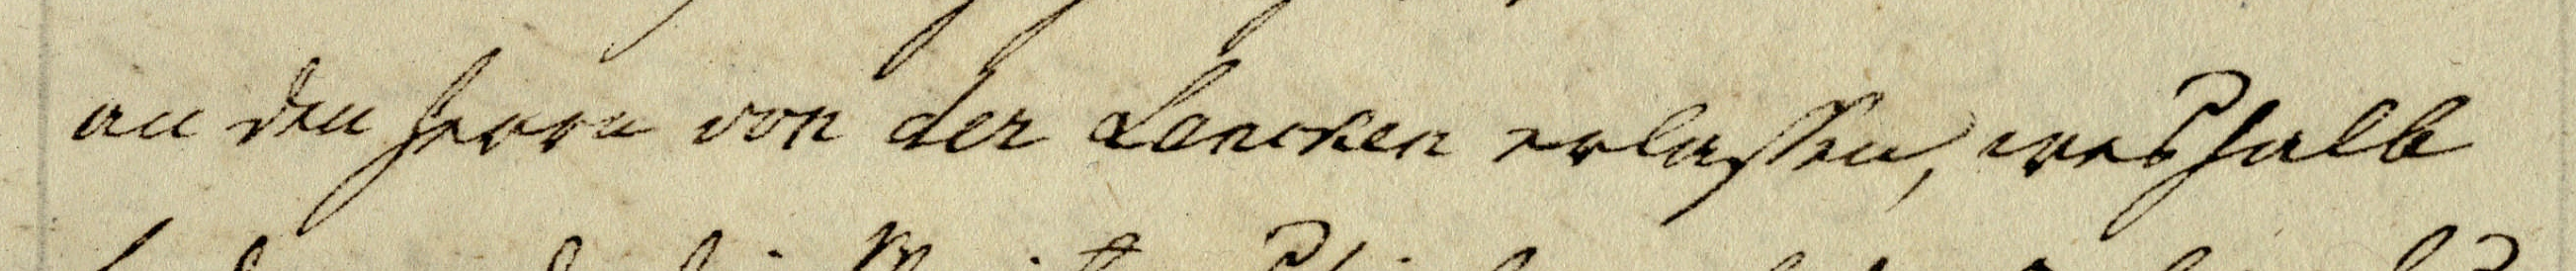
an den Herrn von der Lancken erlassen, weshalb
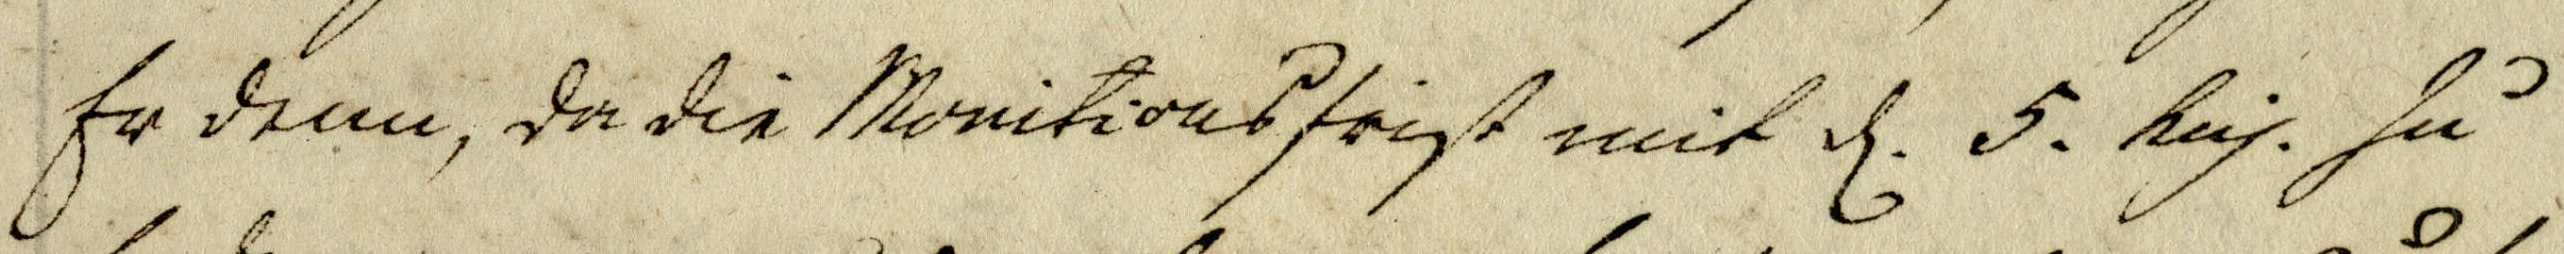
Er denn, da die Monitionsfrist mit d. 5. huj. zu
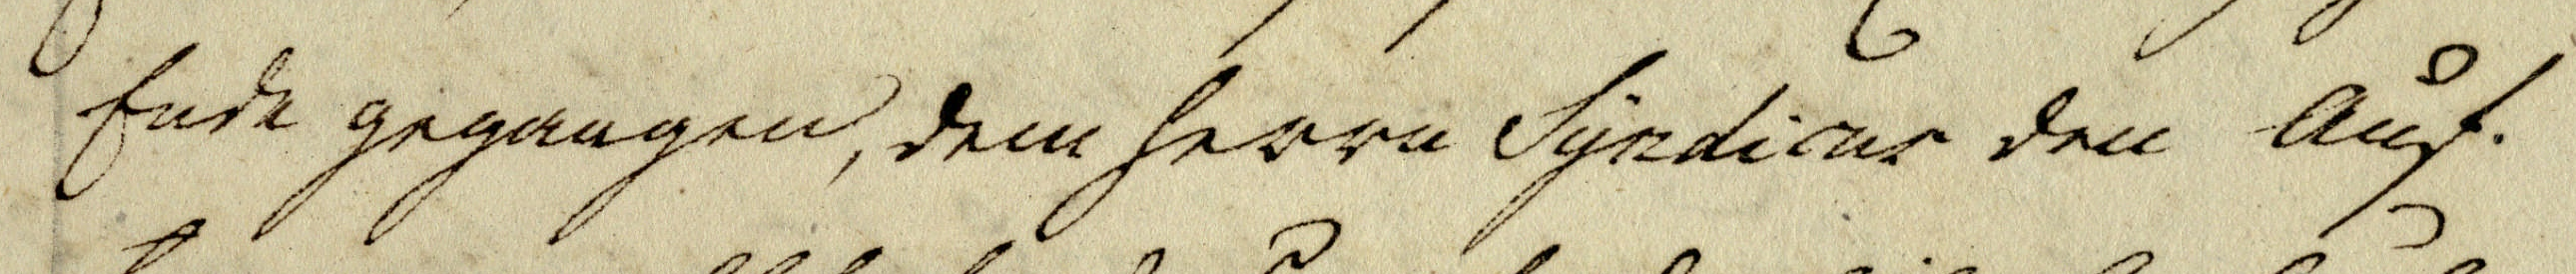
Ende gegangen, dem Herrn Sÿndicus den Auf¬
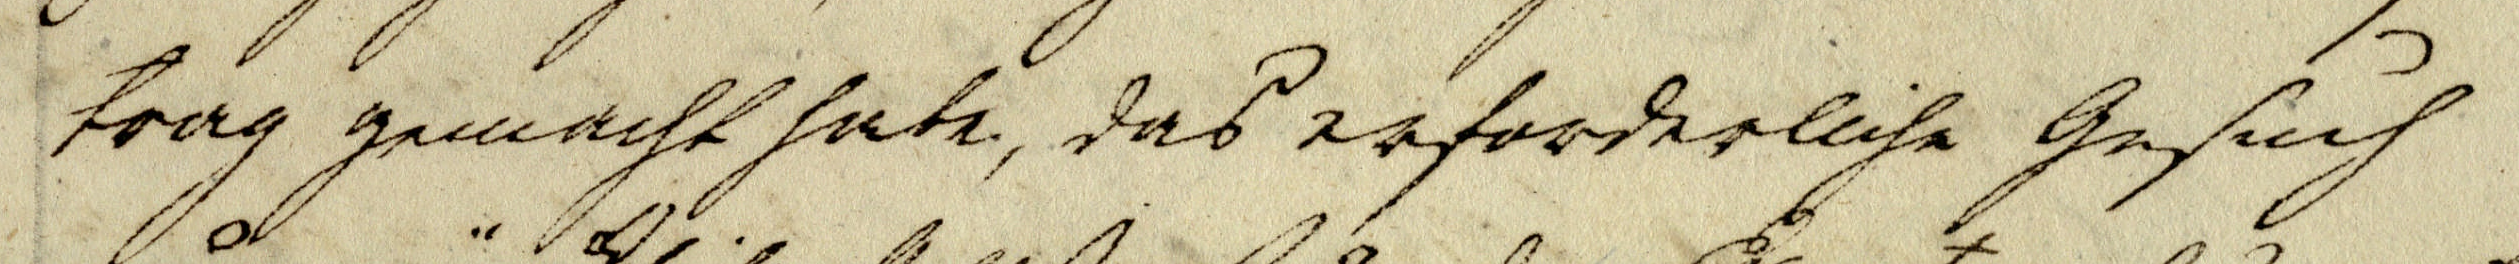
trag gemacht habe, das erforderliche Gesuch
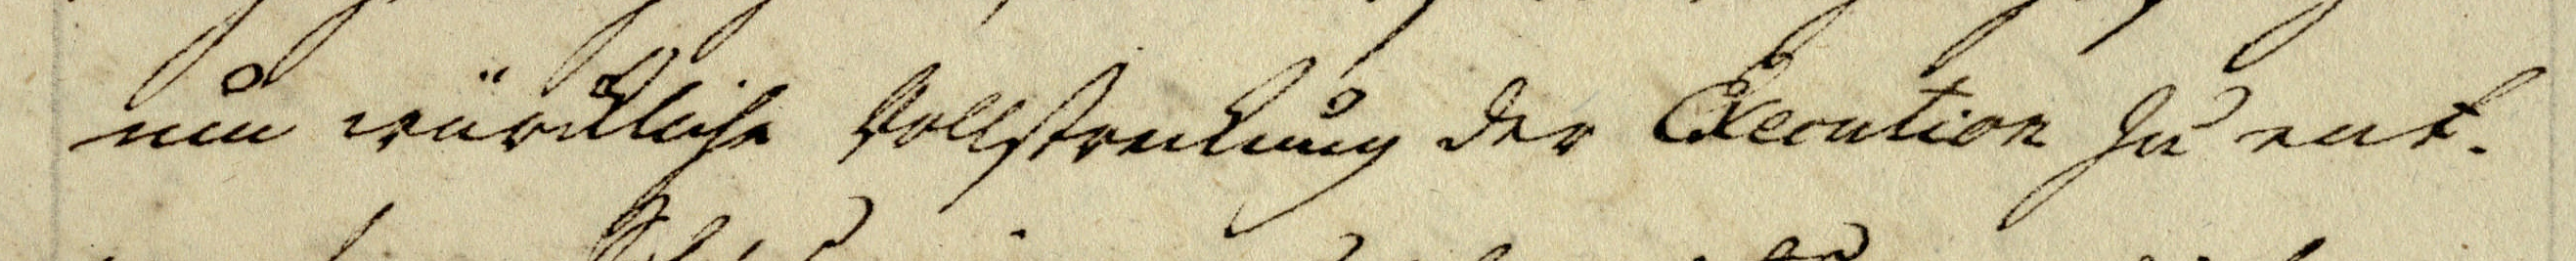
um würckliche Vollstreckung der Execution zu ent¬
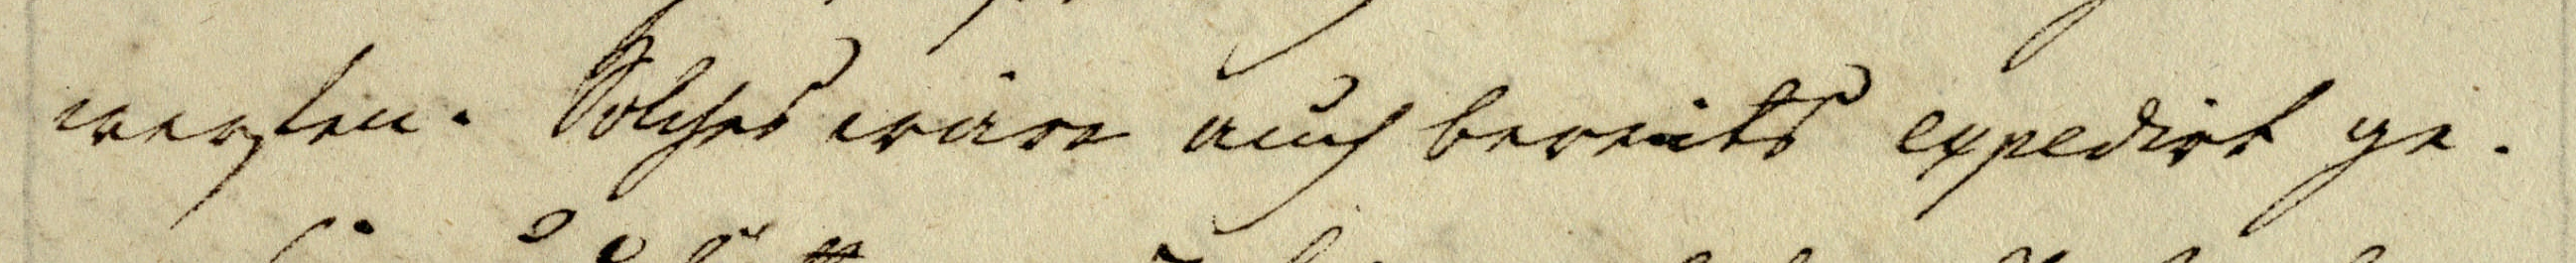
werfen. Solches wäre auch bereits expedirt ge¬
